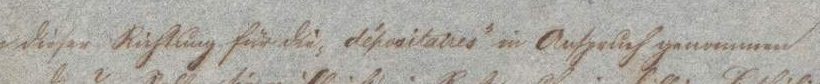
in dieser Richtung für die «dépositaires» in Anspruch genommen
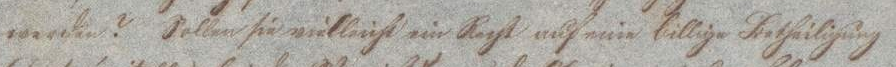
werden? Sollen sie vielleicht ein Recht auf eine billige Betheiligung
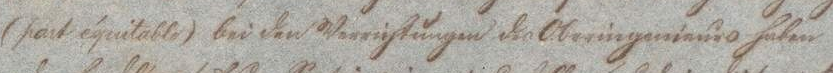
(part équitable) bei den Verrichtungen des Oberingenieurs haben
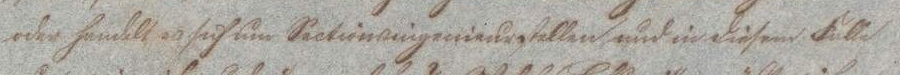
oder handelt es sich um Sectionsingenieursstellen un in diesem Falle
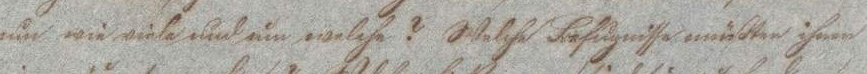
um wie viele und um welche? Welche Befugnisse müßten ihnen
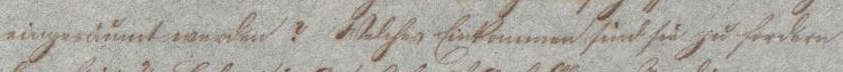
eingeräumt werden? Welches Einkommen sind sie zu fordern
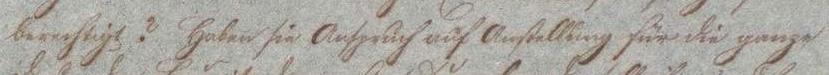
berechtigt? Haben sie Anspruch auf Anstellung für die ganze
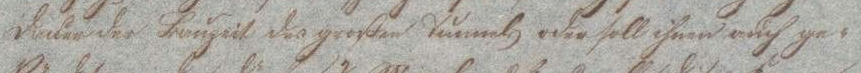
Dauer der Bauzeit des großen Tunnels oder soll ihnen auch ge-
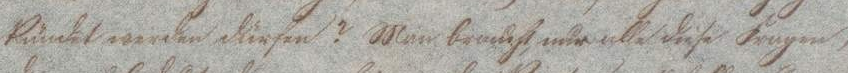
kündet werden dürfen? Man braucht nur alle diese Fragen,
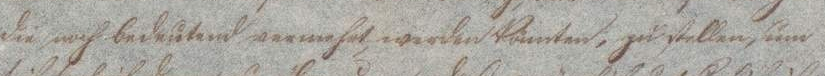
die noch bedeutend vermehrt werden könnten, zu stellen, um
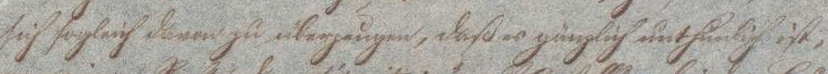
sich sogleich davon zu überzeugen, daß es gänzlich unthunlich ist,
